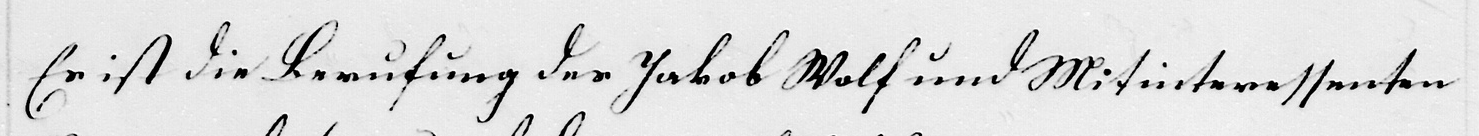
Es ist die Berufung des Jakob Wolf und Mitinteressenten
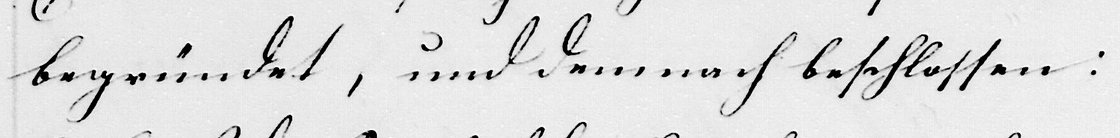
begründet, und demnach beschlossen:
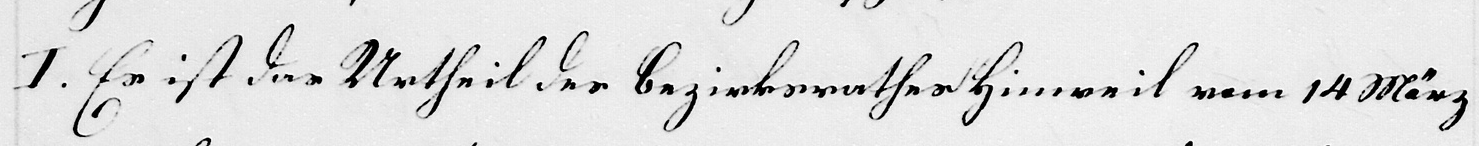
I. Es ist das Urtheil des Bezirksrathes Hinweil vom 14 März
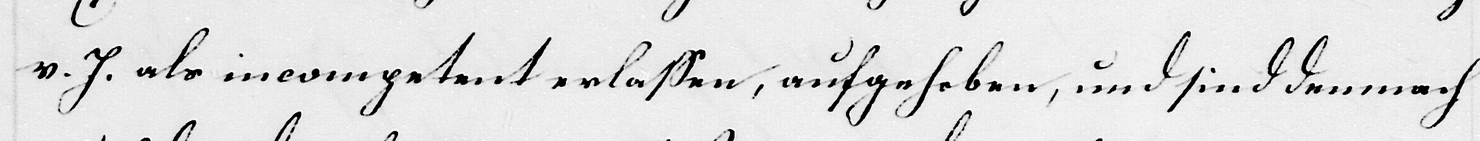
v. J. als incompetent erlaßen, aufgehoben, und sind demnach
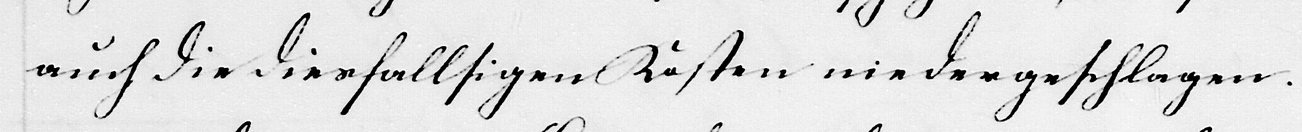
auch die diesfallsigen Kosten niedergeschlagen.
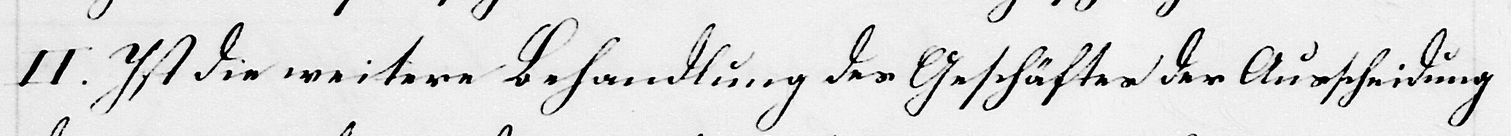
II. Ist die weitere Behandlung des Geschäftes der Ausscheidung
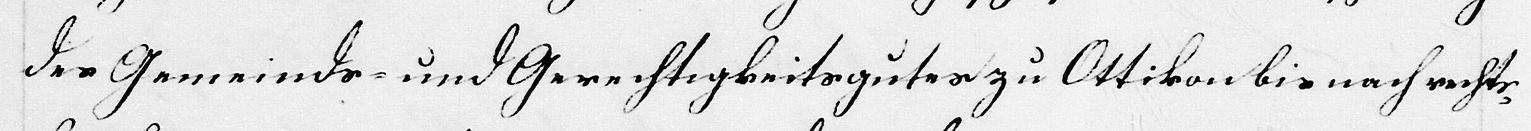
des Gemeinds- und Gerechtigkeitsgutes zu Ottikon bis nach rechts¬
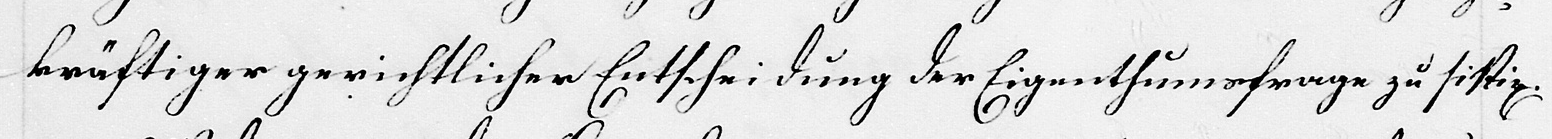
kräftiger gerichtlicher Entscheidung der Eigenthumsfrage zu sisti¬
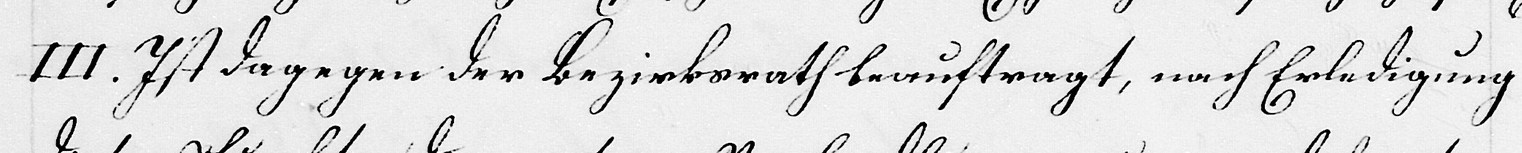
III. Ist dagegen der Bezirksrath beauftragt, nach Erledigung
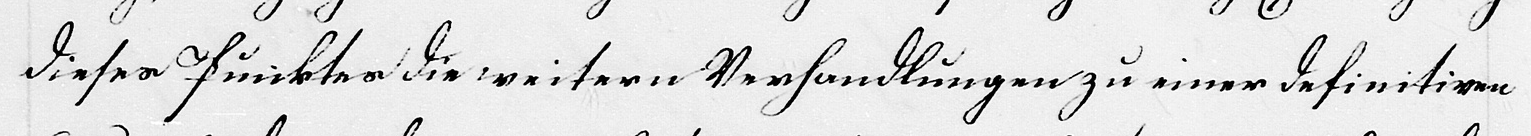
dieses Punktes die weitern Verhandlungen zu einer definitiven
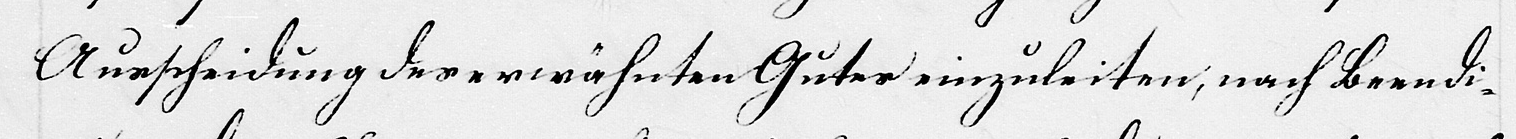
Ausscheidung des erwähnten Gutes einzuleiten, nach Beendi¬
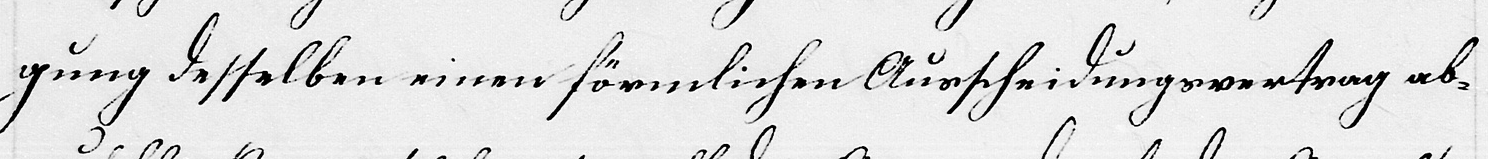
gung desselben einen förmlichen Ausscheidungsvertrag ab¬
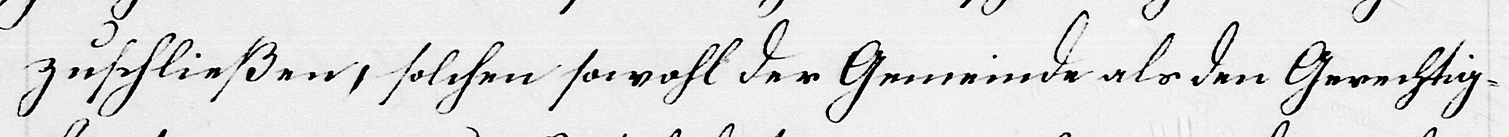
zuschließen, solchen sowohl der Gemeinde als den Gerechtig¬
